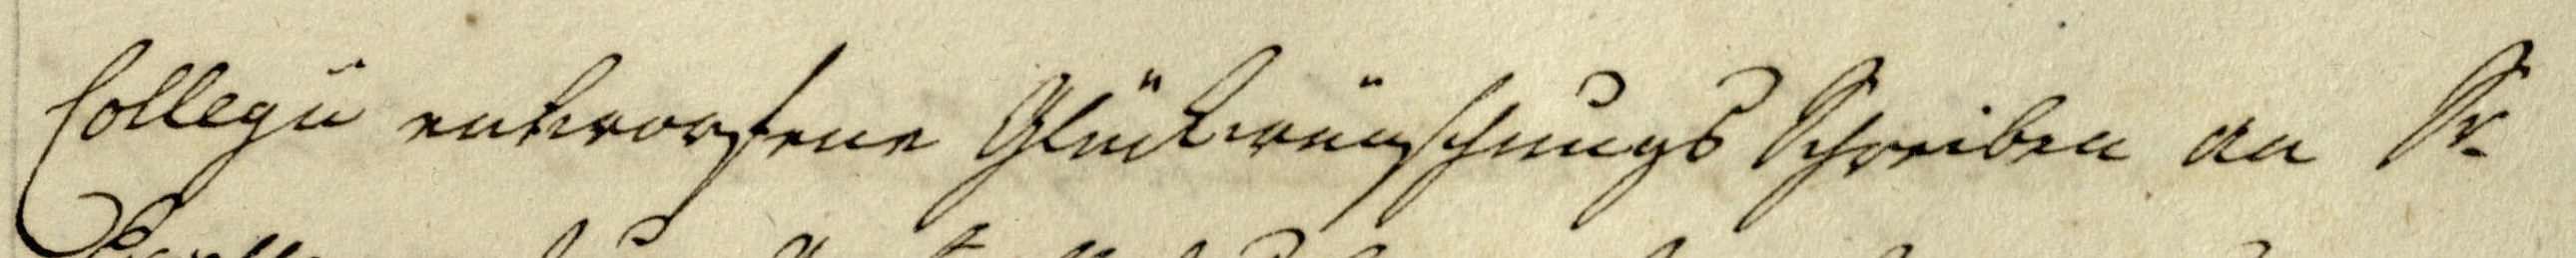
Collegii entworfene Glückwünschungs Schreiben an Sr
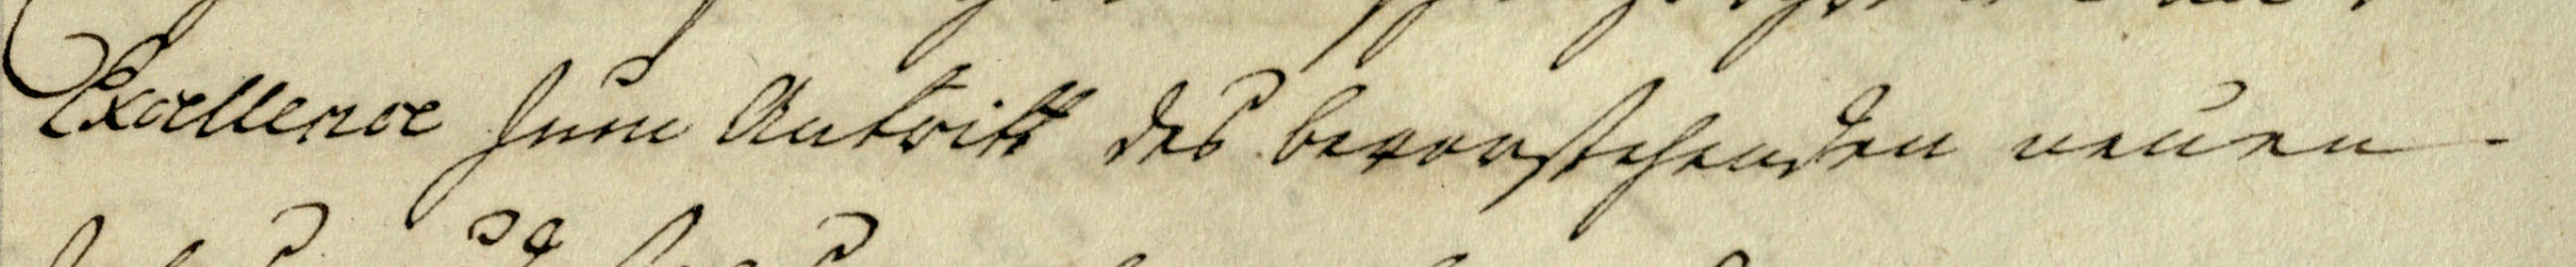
Excellence zum Antritt des bevorstehenden neuen
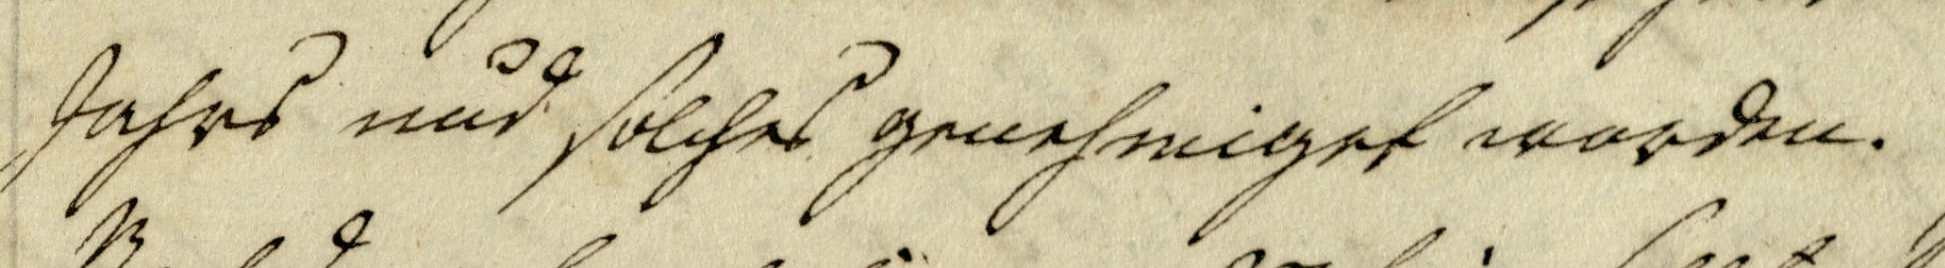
Jahres und solches genehmiget worden.
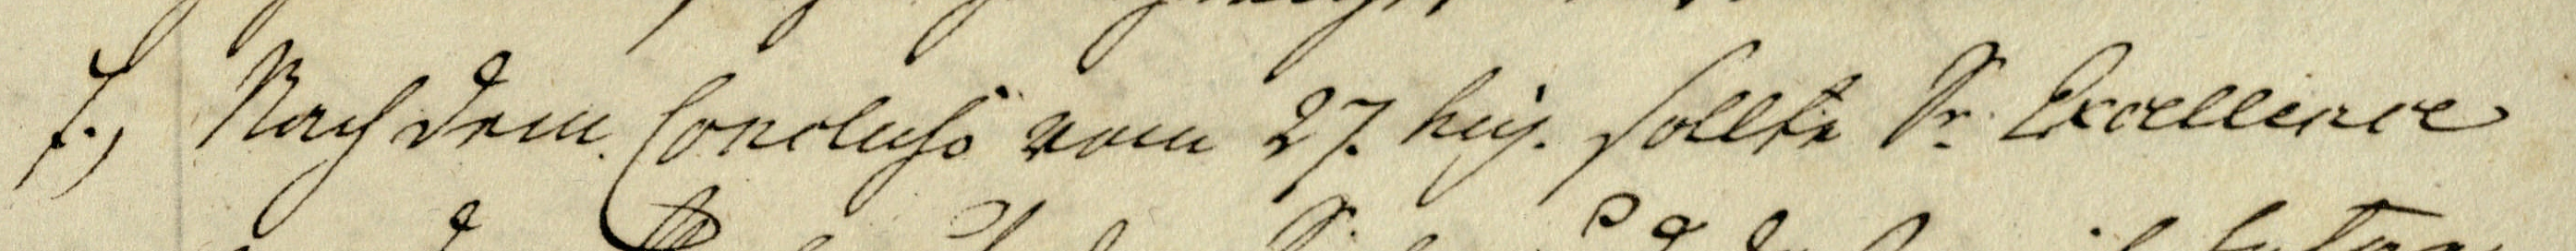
7., Nach dem Concluso vom 27. huj. sollte Sr Excellence
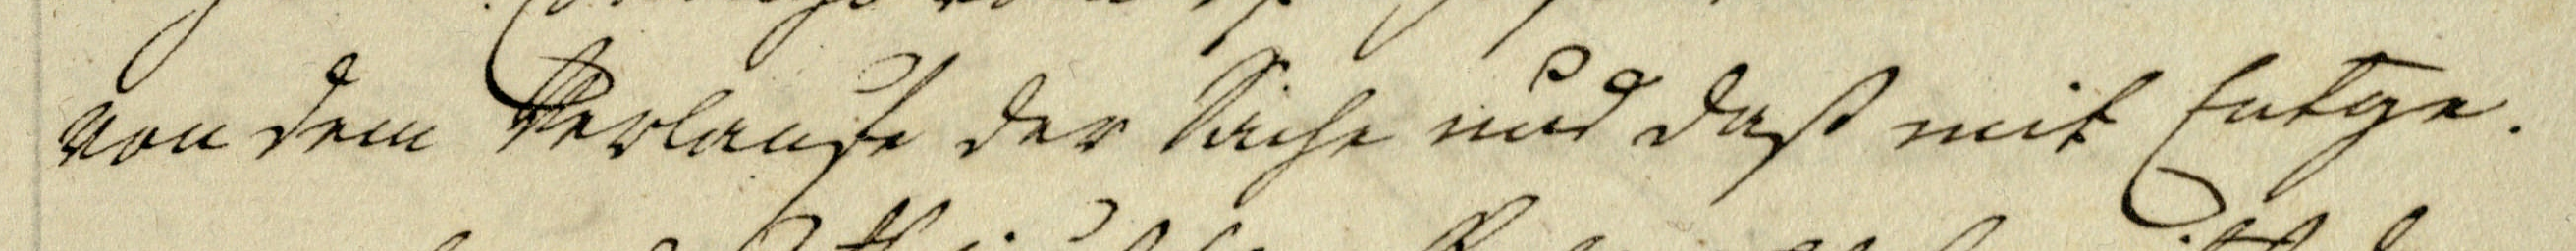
von dem Verlaufe der Sache und daß mit Entge¬
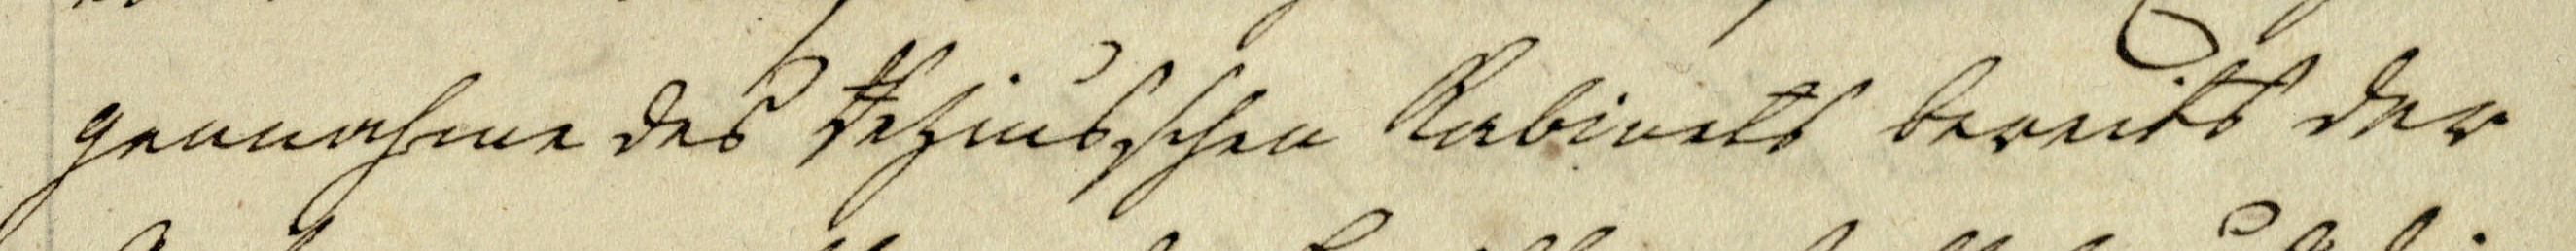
gennahme des Reziusschen Kabinets bereits der
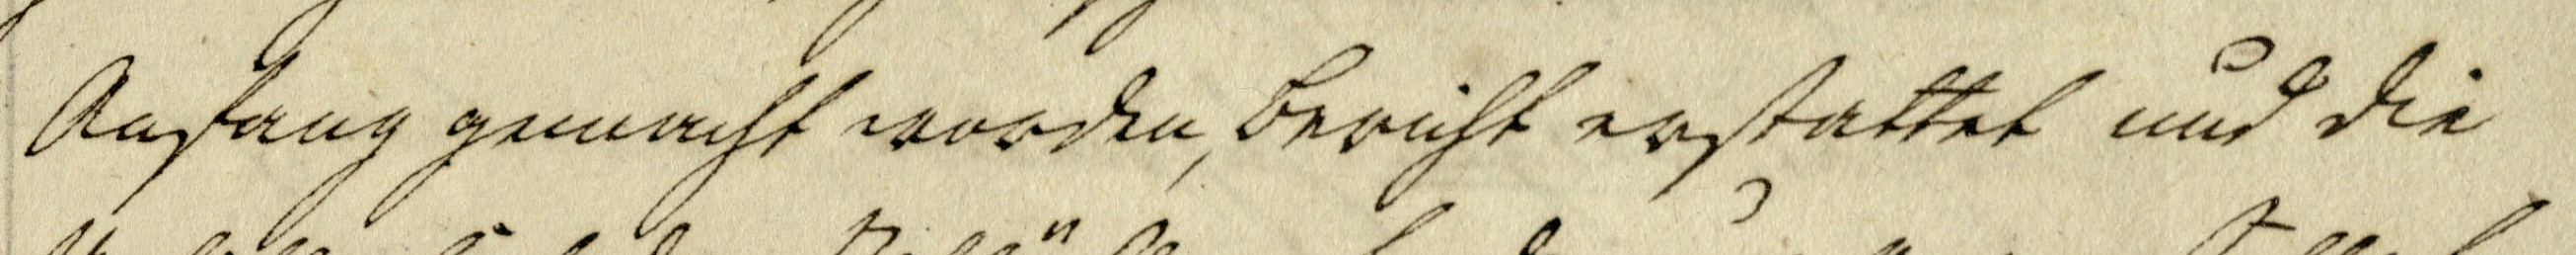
Anfang gemacht worden, Bericht erstattet und die
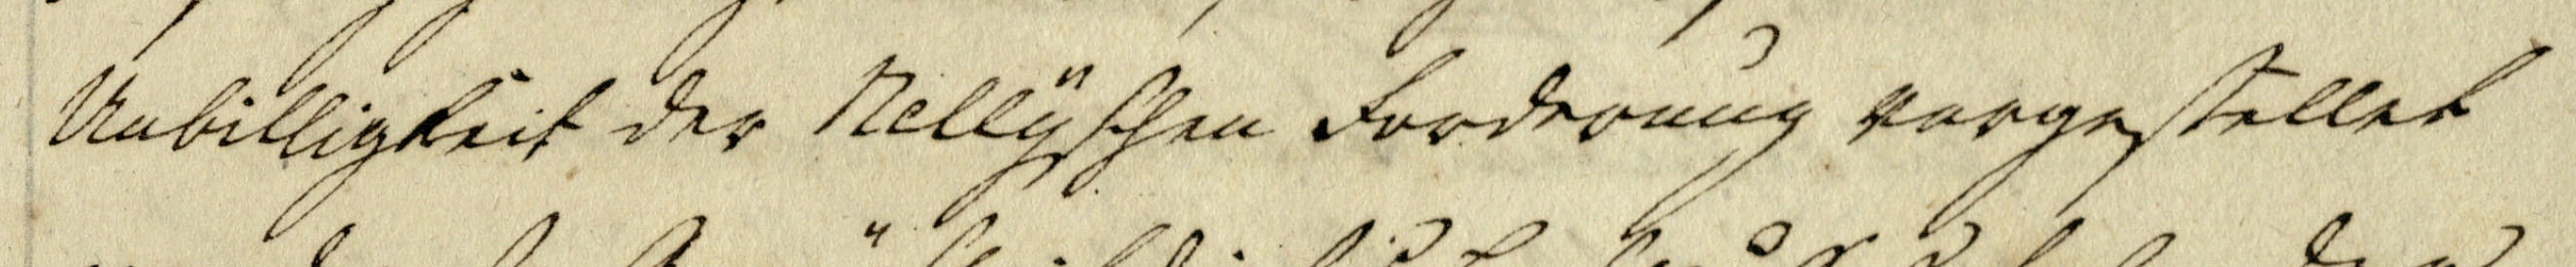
Unbilligkeit der Nellÿschen Forderung vorgestellet
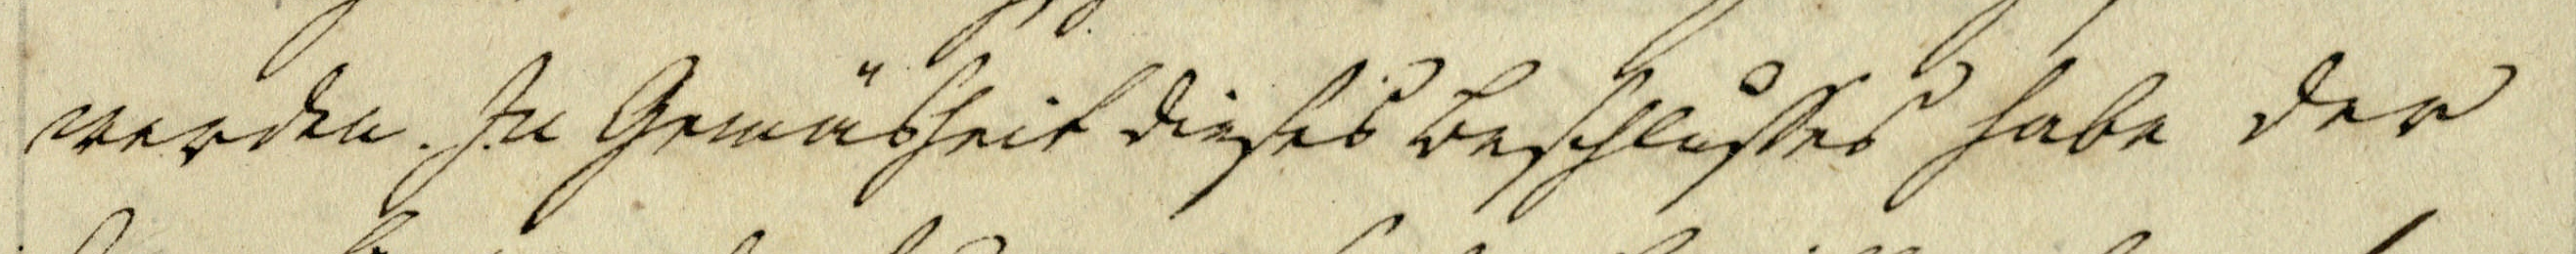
werden. In Gemäsheit dieses Beschlusses habe der
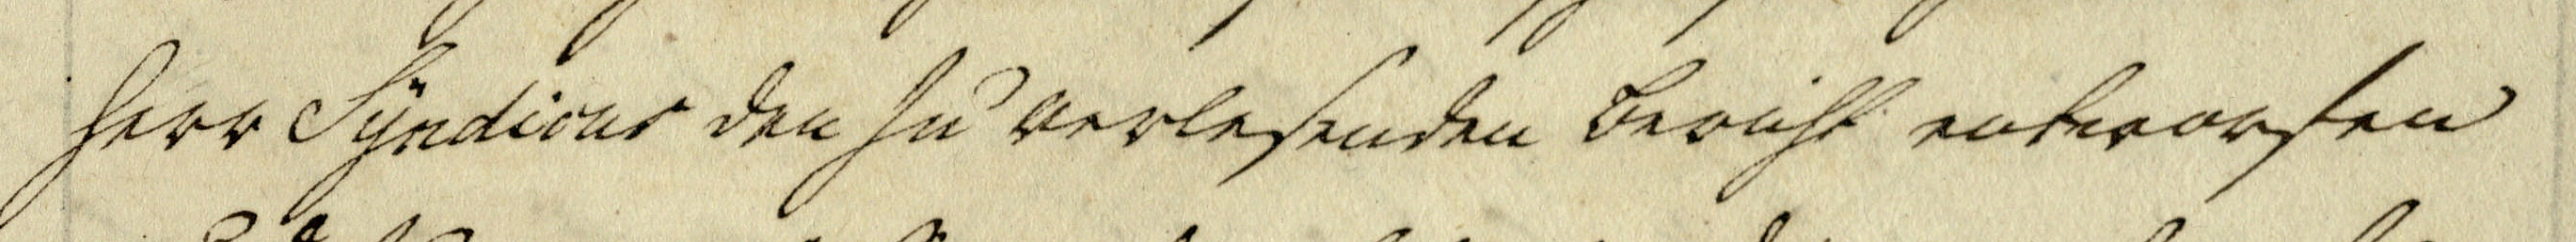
Herr Sÿndicus den zu verlesenden Bericht entworfen
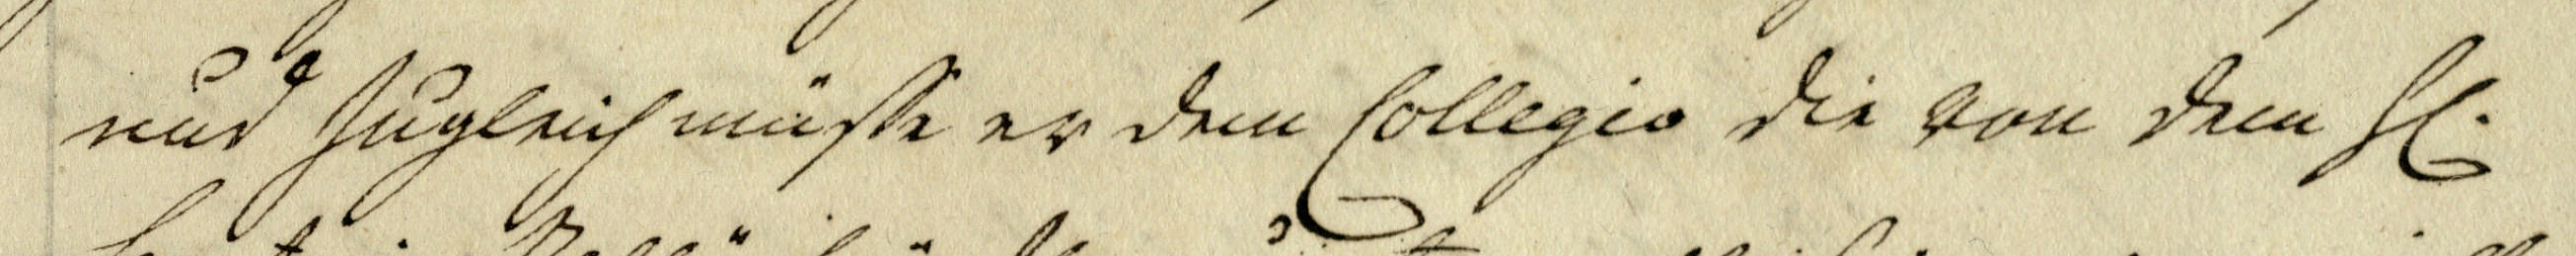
und zugleich müsse er dem Collegio die von dem H.
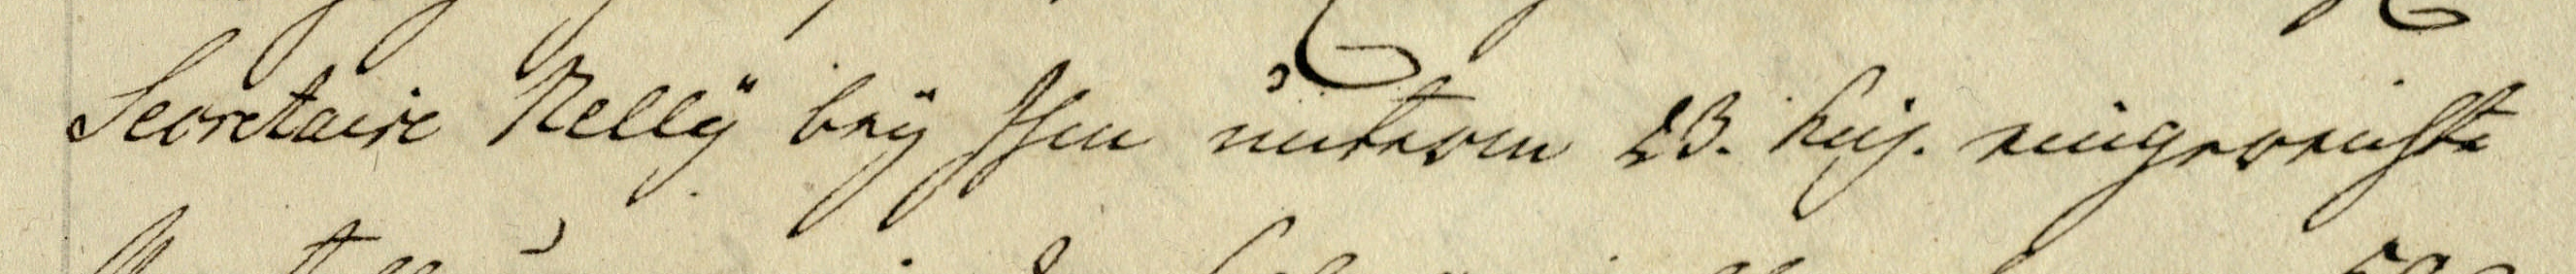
Secretaire Nellÿ beÿ Ihm unterm 23. huj. eingereichte
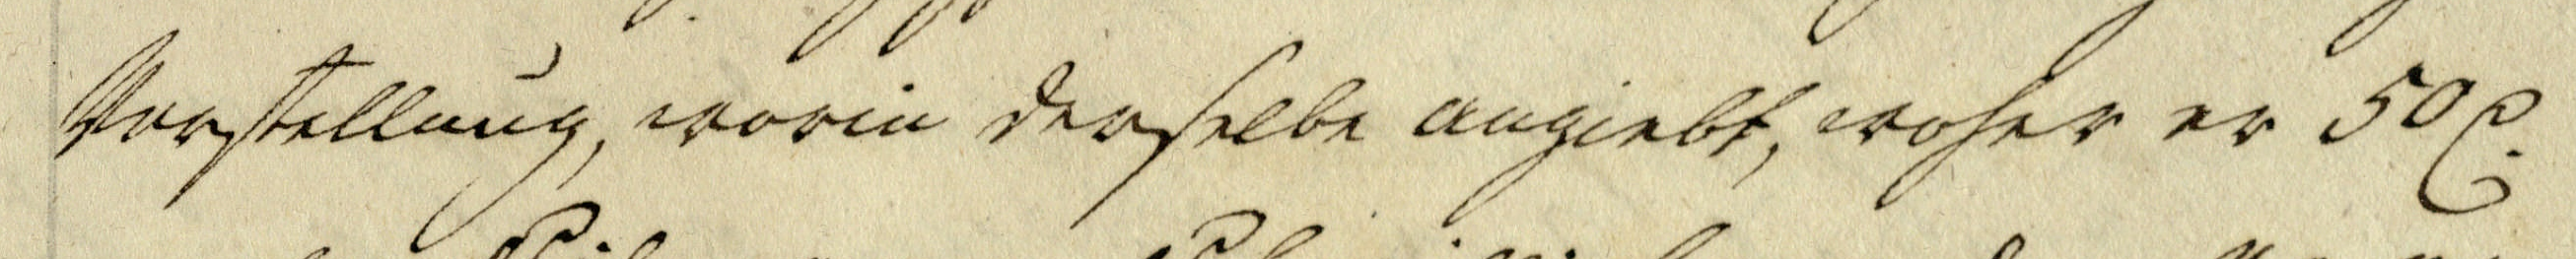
Vorstellung, worin derselbe angiebt, woher er 50 l.
